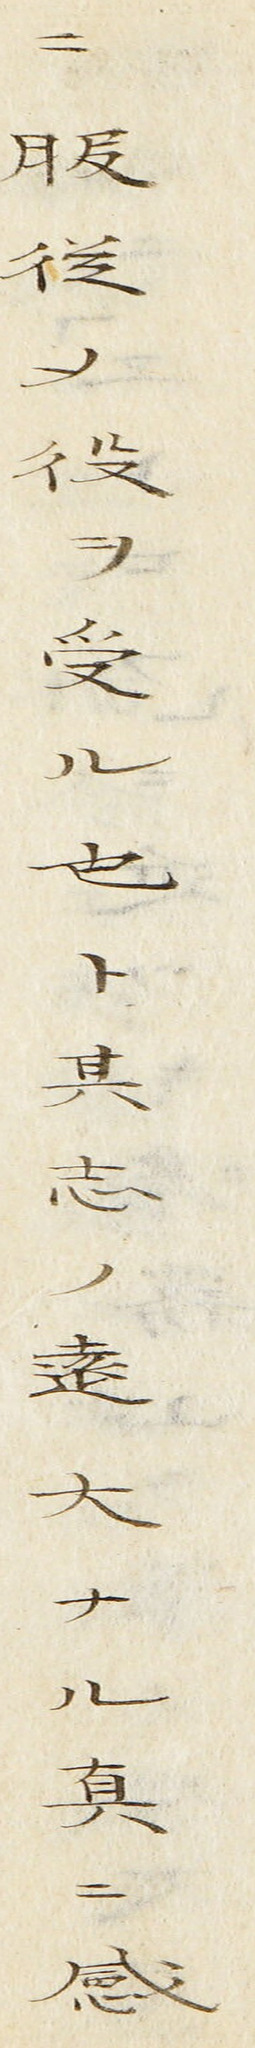ニ服従シテ役ヲ受ル也ト其志ノ遠大ナル真ニ感
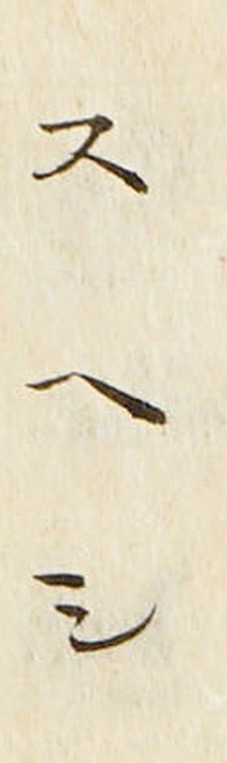スヘシ
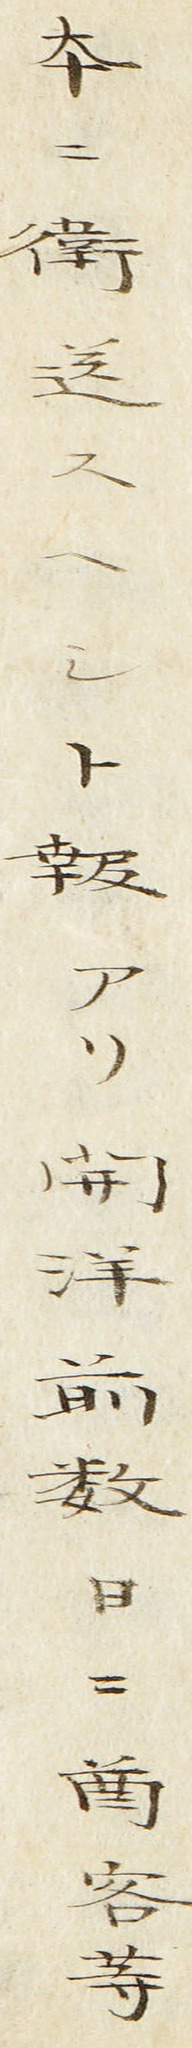本ニ衛送スヘシト報アリ開洋前数日ニ酋客等
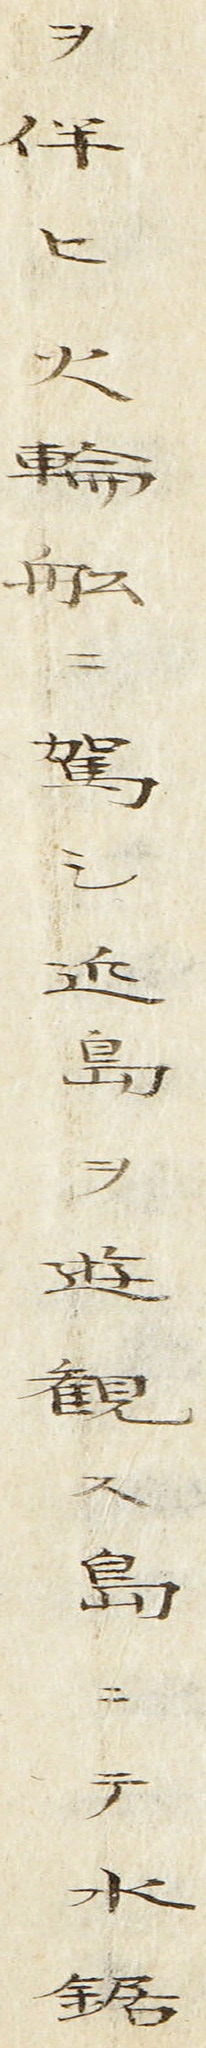ヲ伴ヒ火輪舩ニ駕シ近島ヲ遊観ス島ニテ水鋸
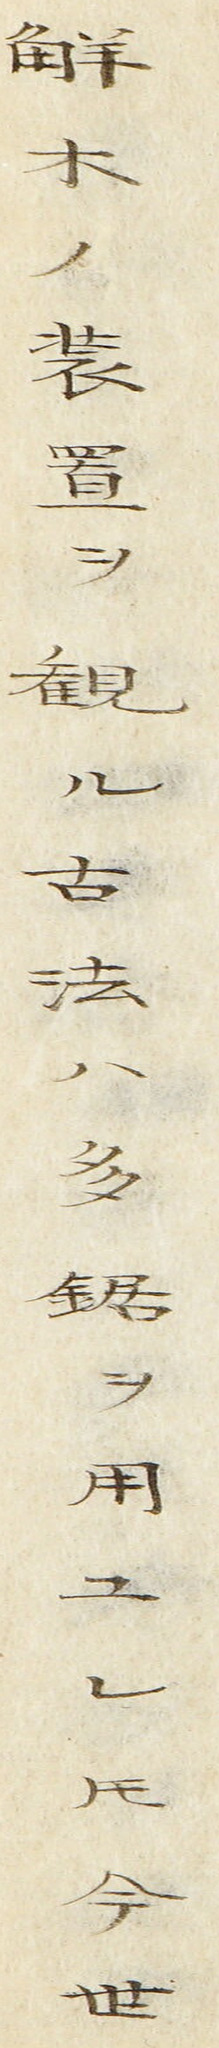解木ノ装置ヲ観ル古法ハ多鋸ヲ用ユレドモ今世

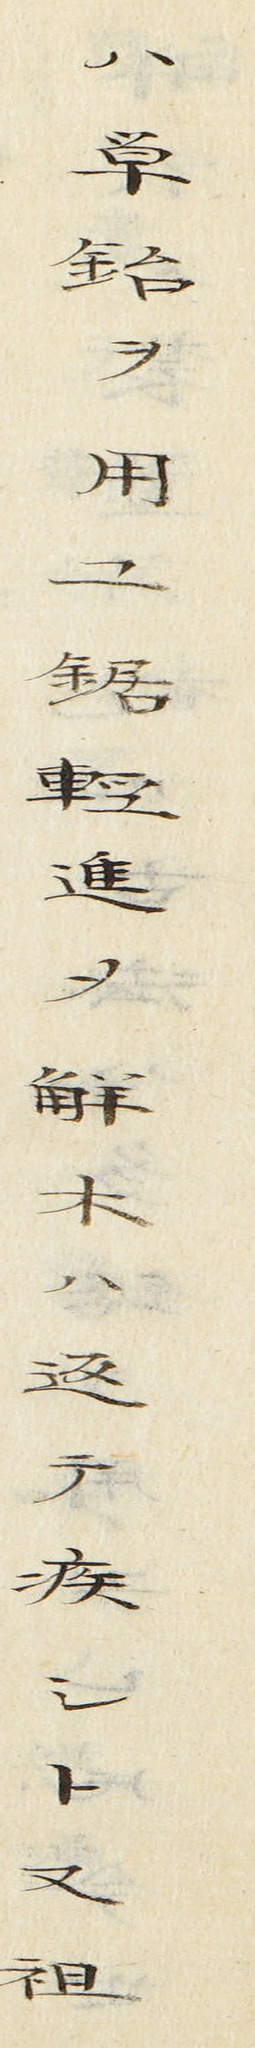ハ単鈶ヲ用ユ鋸軽進シテ解木ハ返テ疾シト又祖
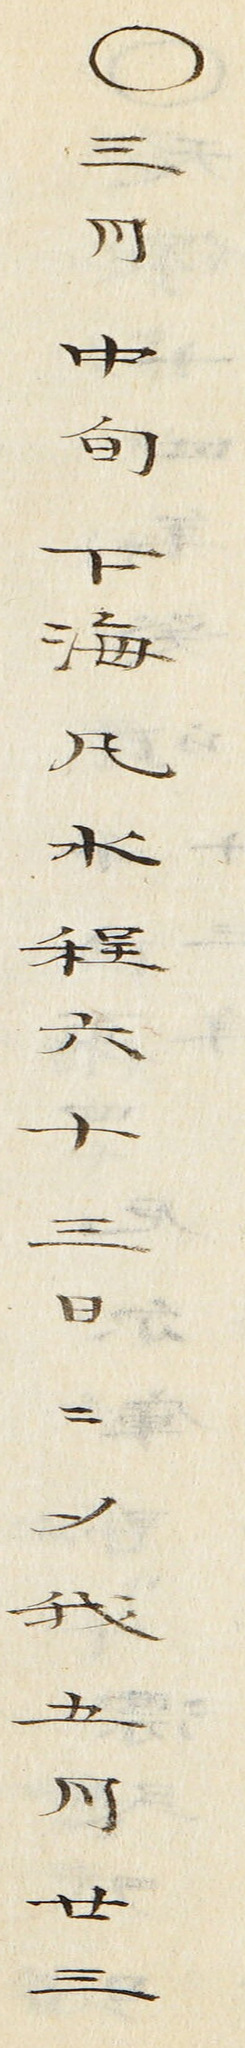〇三月中旬下海凡水程六十三日ニシテ我五月廿三
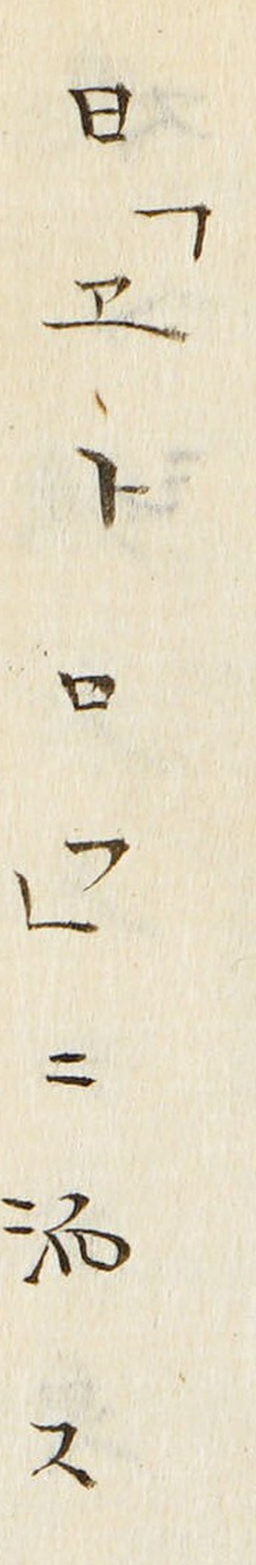日「ヱトロフ」ニ泊ス
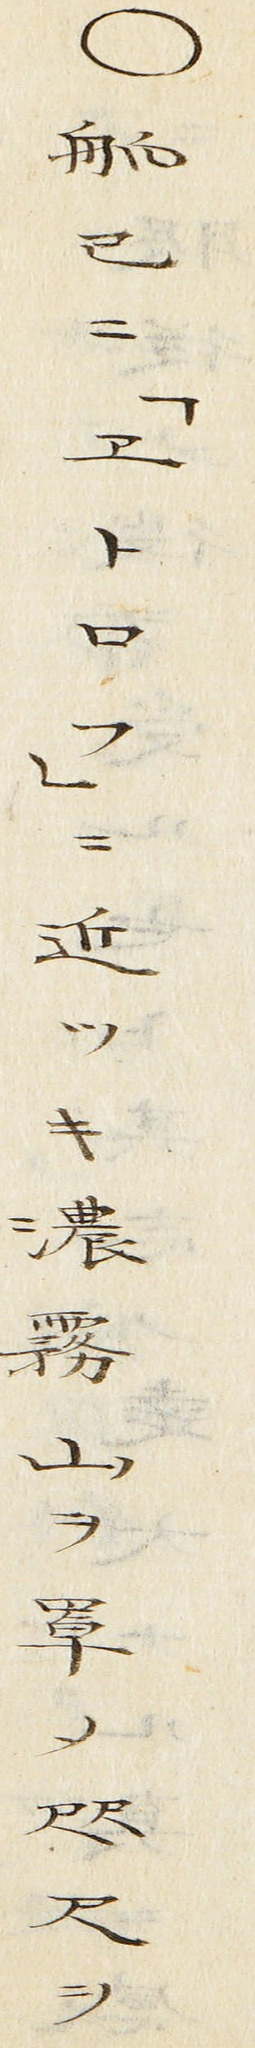〇舶已ニ「ヱトロフ」ニ近ツキ濃霧山ヲ罩シテ咫尺ヲ
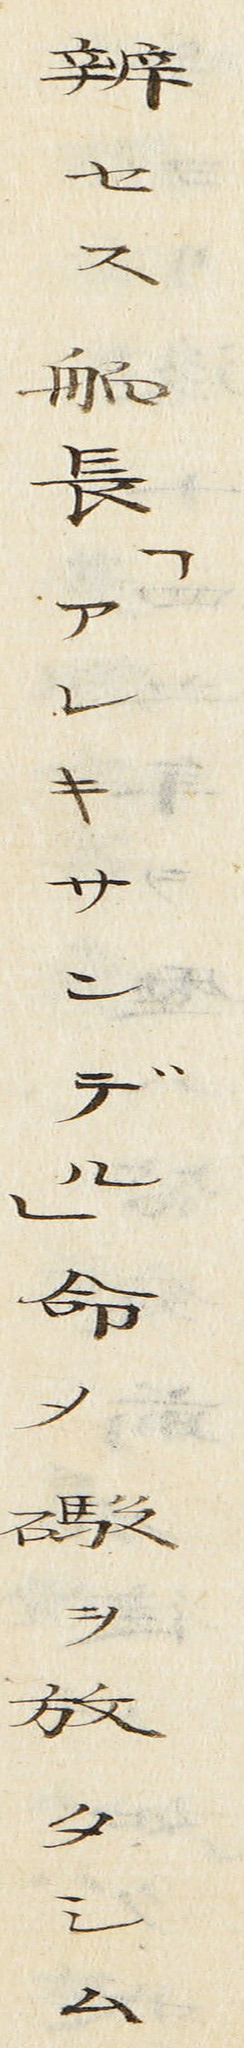弁セス舶長「アレキサンデル」命シテ礟ヲ放タシム
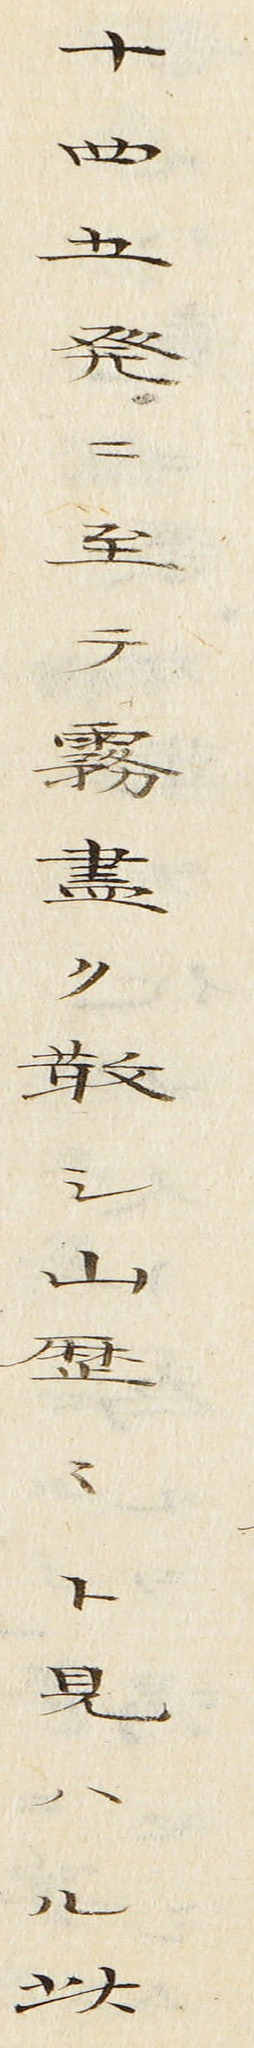十四五発ニ至テ霧尽ク散シ山歴々ト見ハル此
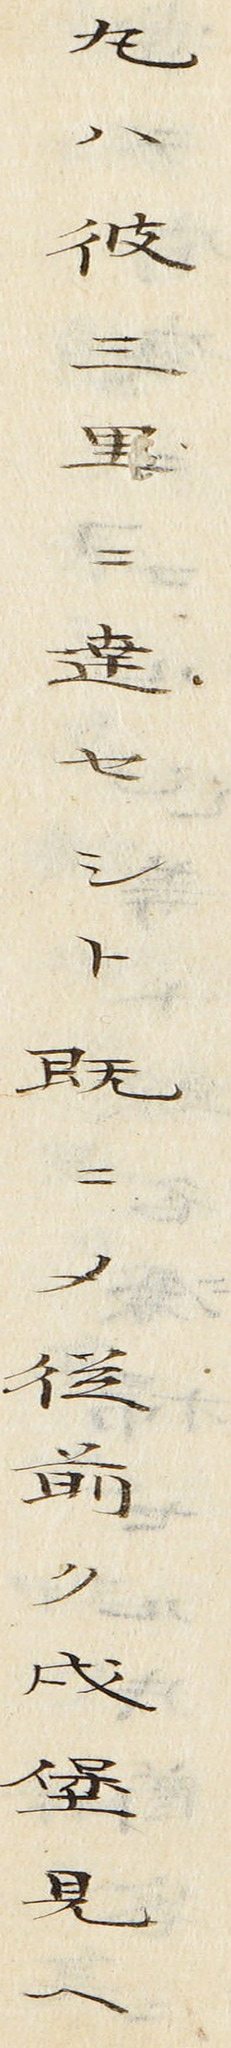ハ彼三里ニ達セシト既ニシテ従前ク戍堡見ヘ
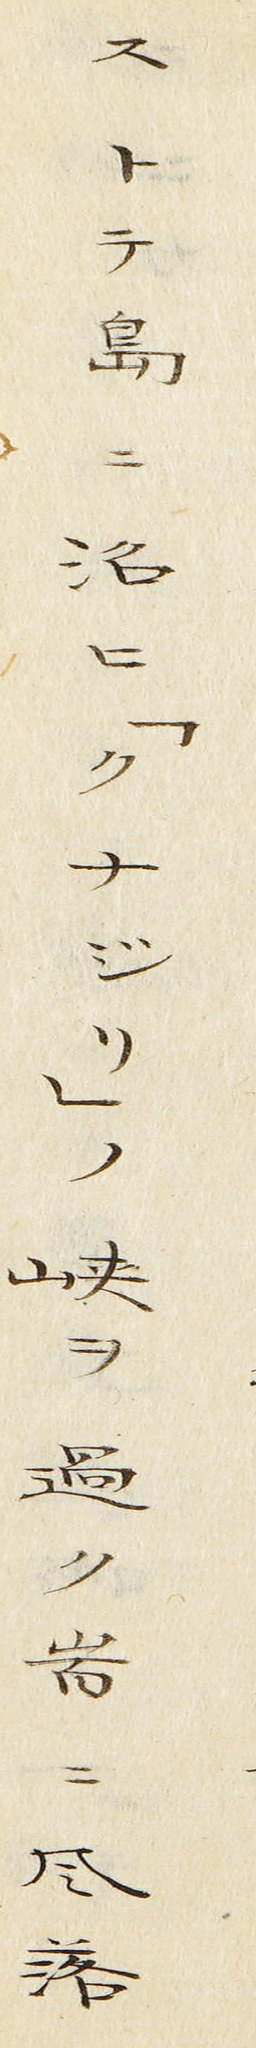ストテ島ニ沿ヒ「クナジリ」ノ峡ヲ過ク時風落
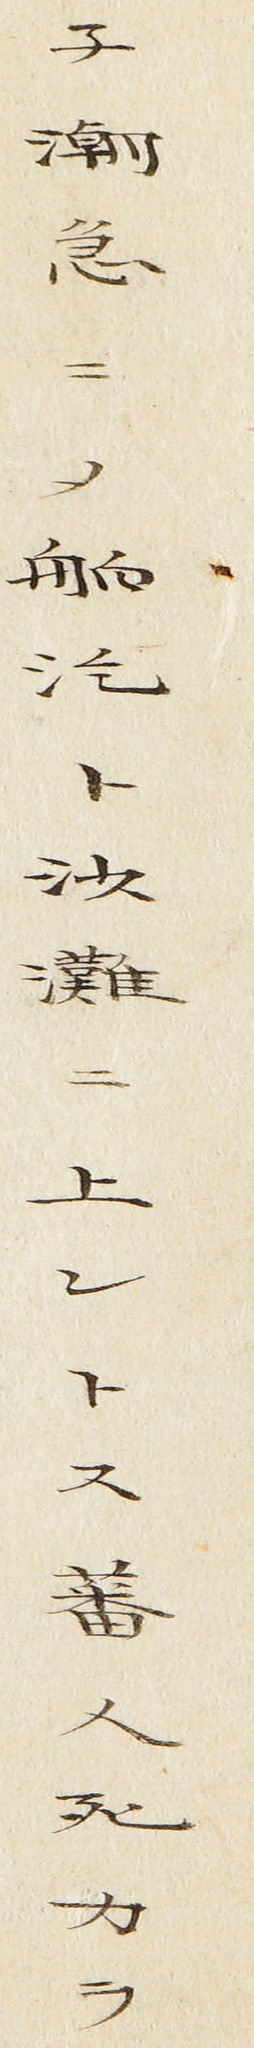子潮急ニシテ舶汔ト沙灘ニ上ントス蕃人死カラ
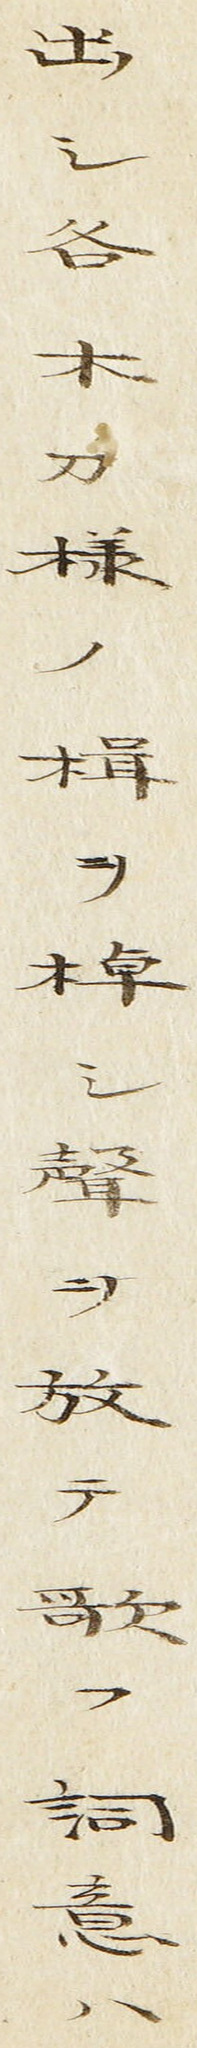出シ各木刀様ノ楫ヲ棹シ声ヲ放テ歌フ詞意ハ
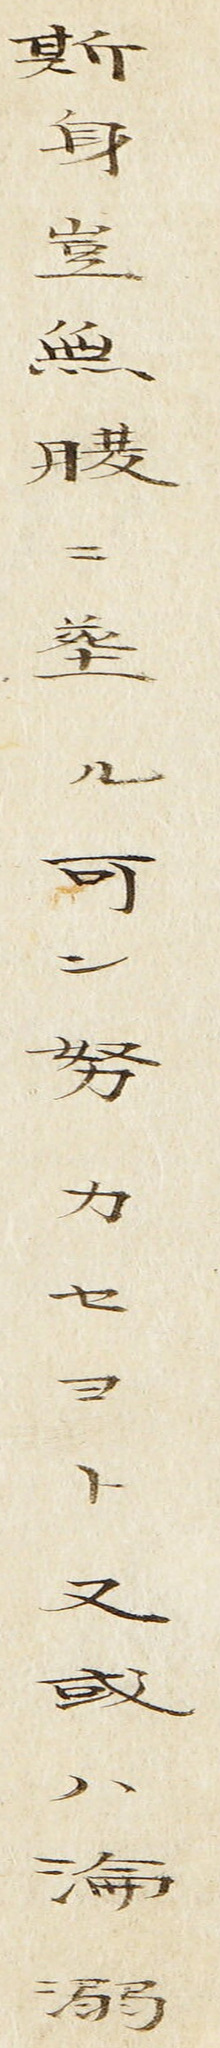斯身豈魚腹ニ葬ル可ン努力セヨト又或ハ淪溺
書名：蕃談
